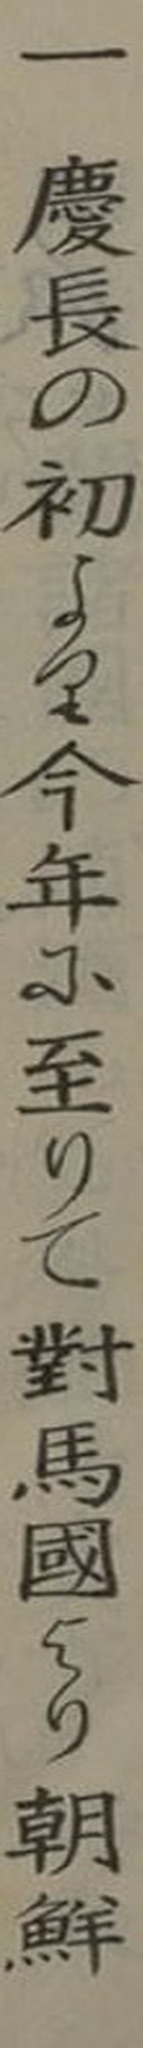一慶長の初より今年に至りて對馬國より朝鮮
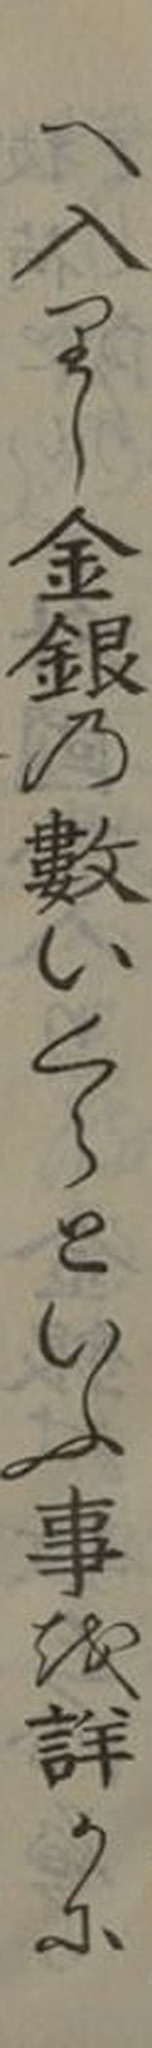へ入りし金銀の數いくらといふ事を詳かに
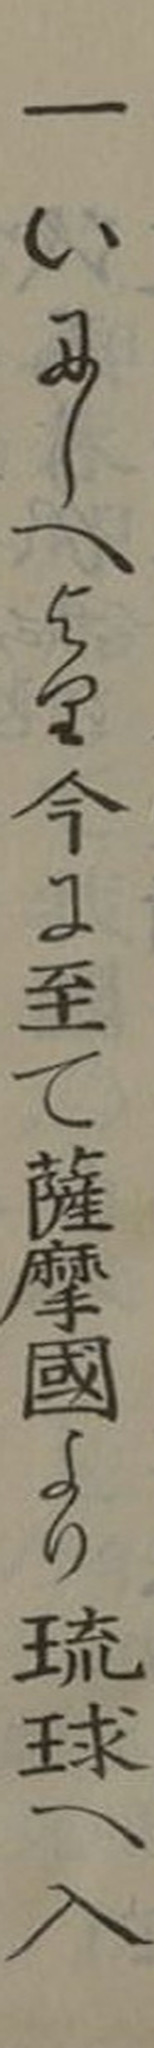一いにしへより今に至て薩摩國より琉球へ入
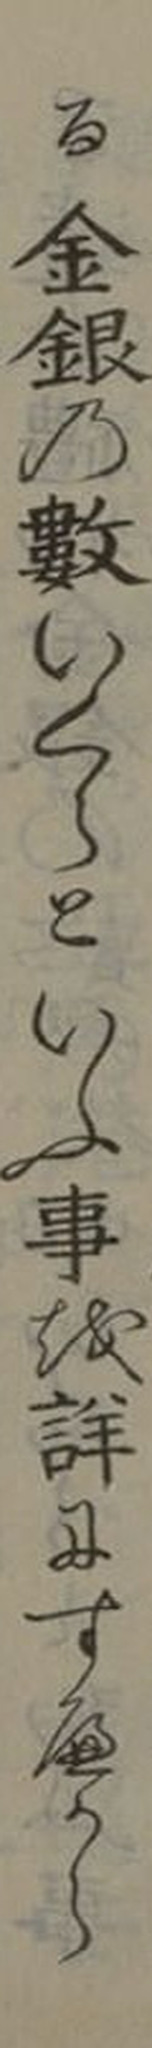る金銀の數いくらといふ事を詳にすへから
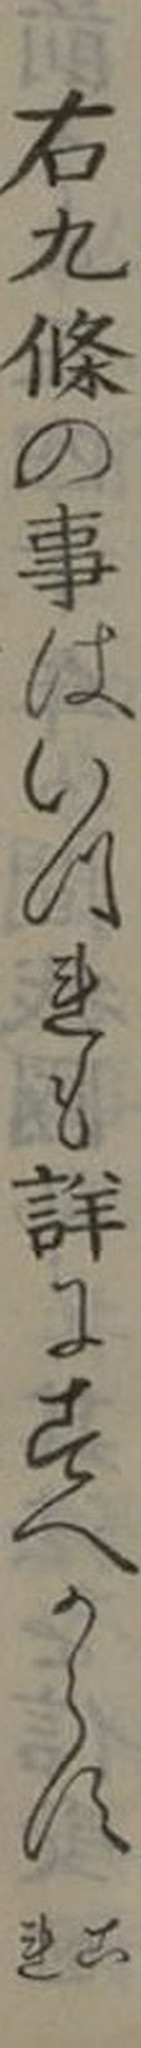右九條の事はいつれも詳にすへからすこれ
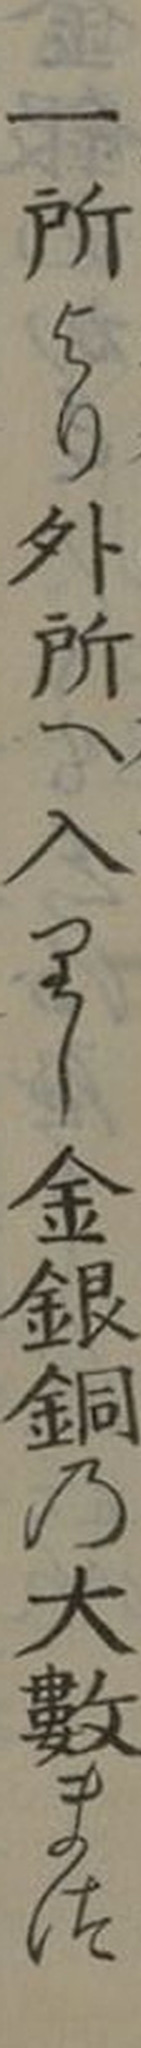一所より外所へ入りし金銀銅の大數まつ
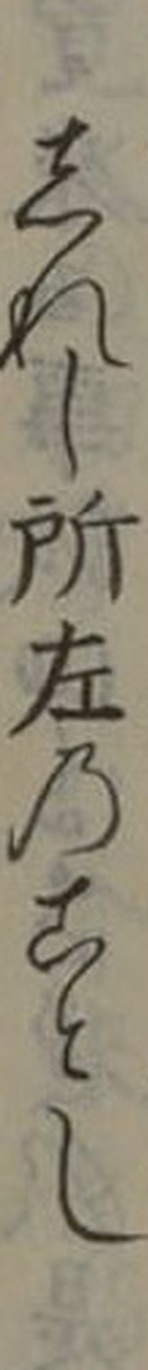しれし所左のことし
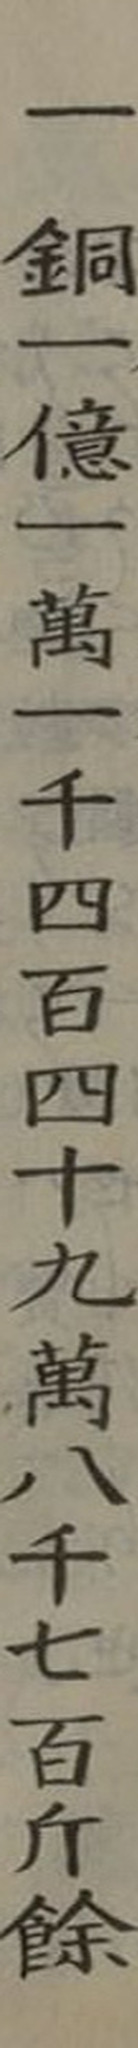一銅一億一萬一千四百四十九萬八千七百斤餘
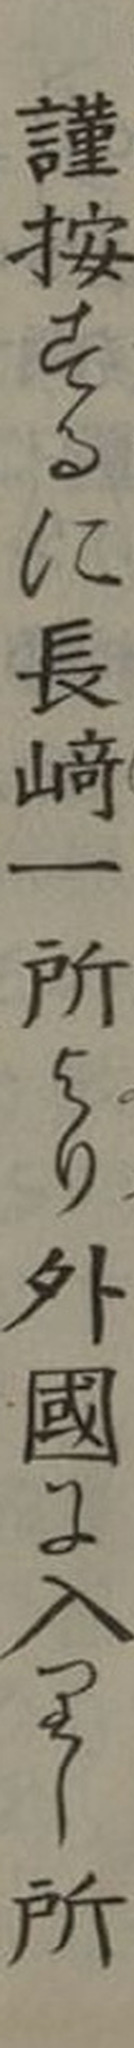謹按するに長崎一所より外國に入りし所
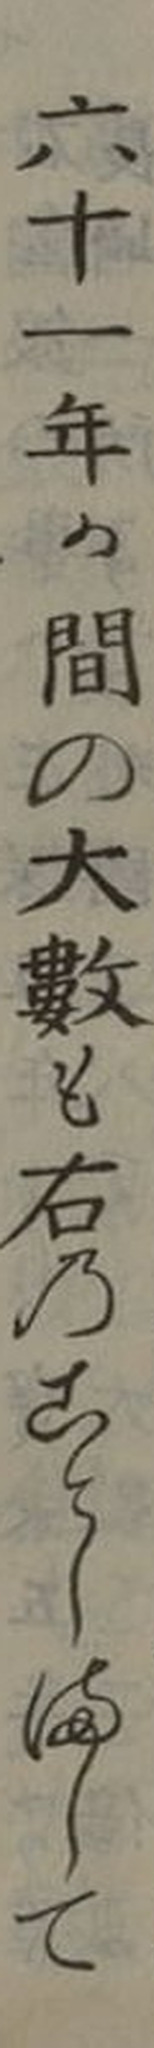六十一年か間の大數も右のことしまして
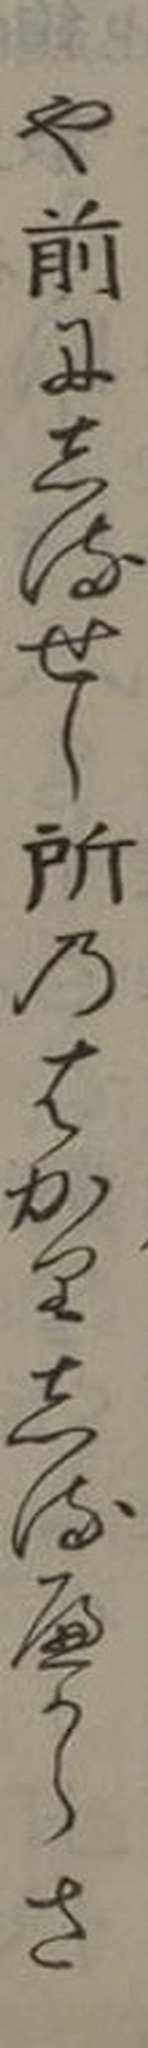や前にしるせし所のはかりしるへからさ
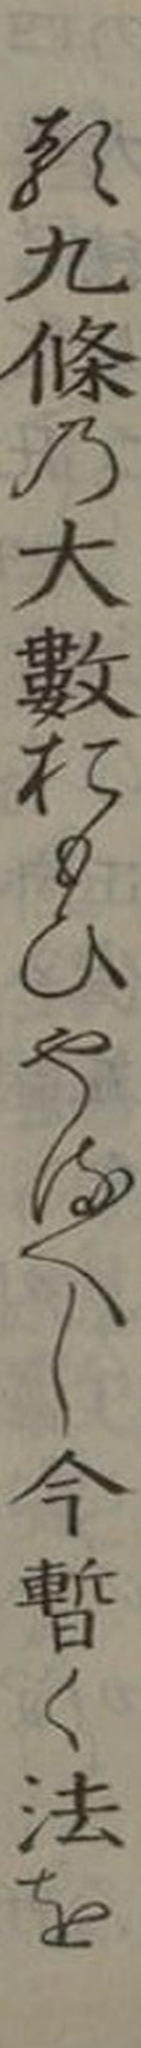る九條の大數おもひやるへし今暫く法を
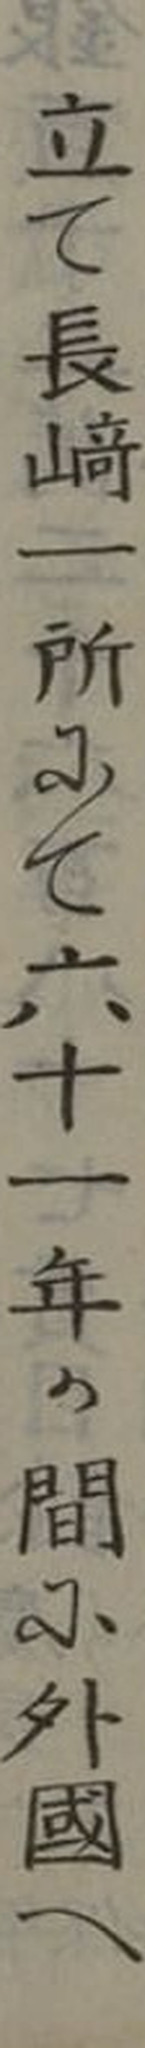立て長﨑一所にて六十一年か間に外國へ
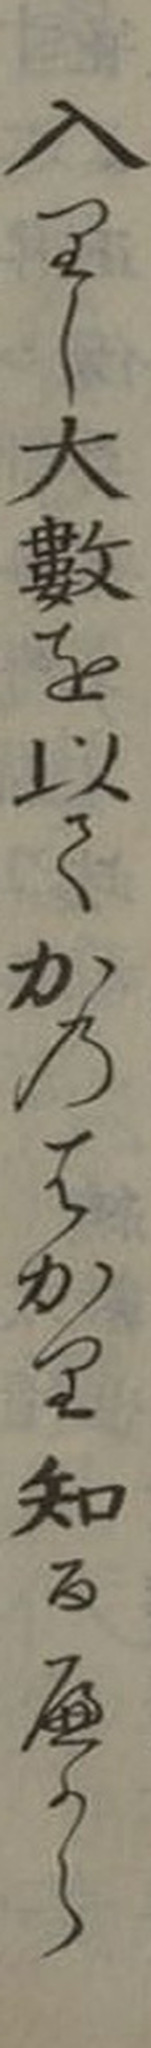入りし大數を以てかのはかり知るへから
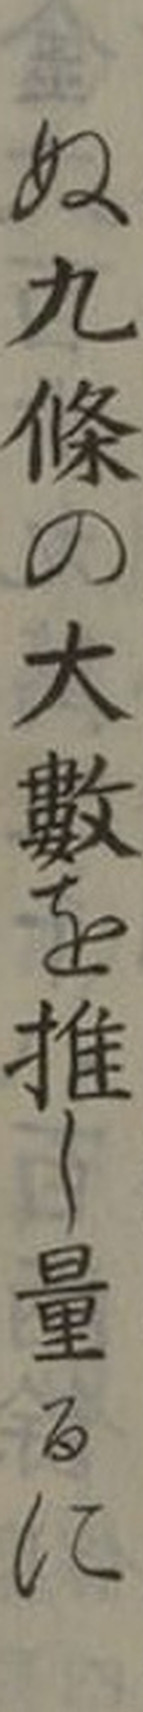ぬ九條の大數を推し量るに

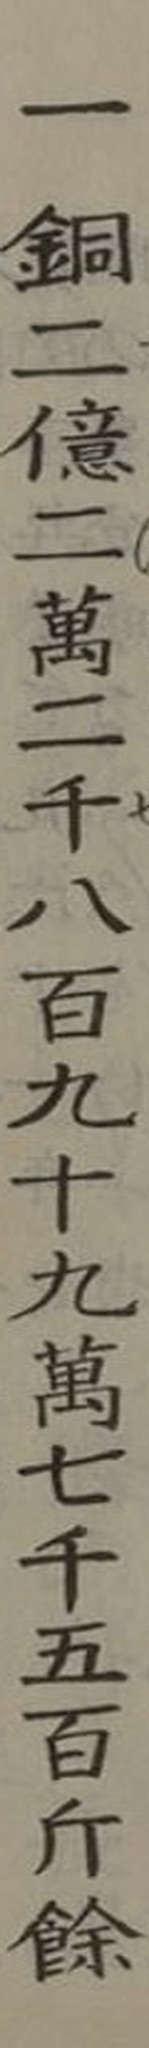一銅二億二萬二千八百九十九萬七千五百斤餘
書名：骨董録
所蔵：University of the Ryukyus Library
